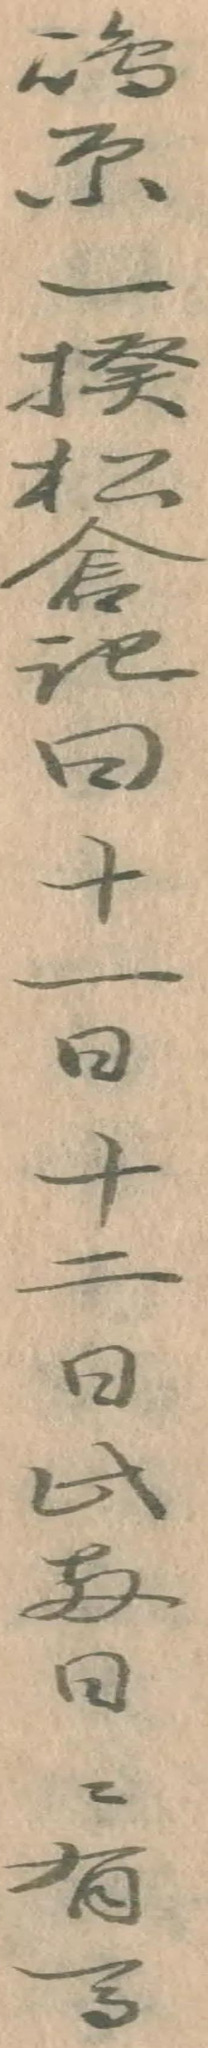島原一揆松倉記曰十一月十二日此両日に有馬
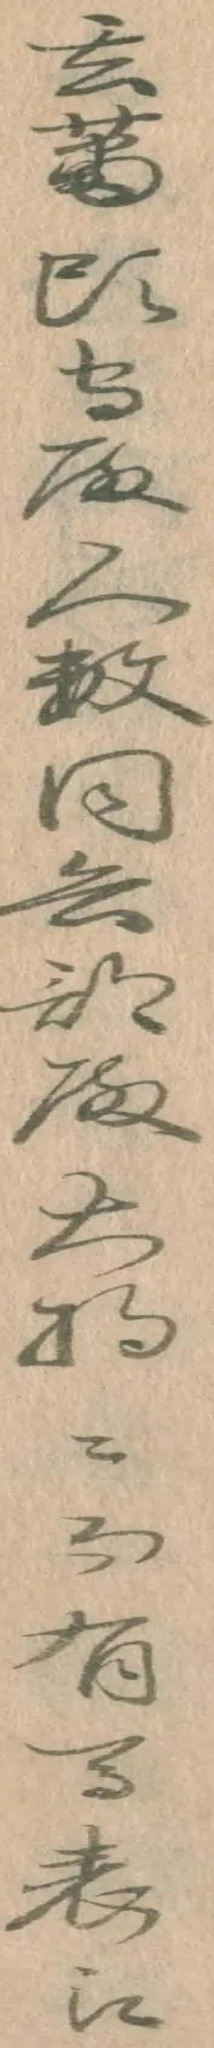玄蕃頭守殿人数同兵部殿大将に而有馬表江
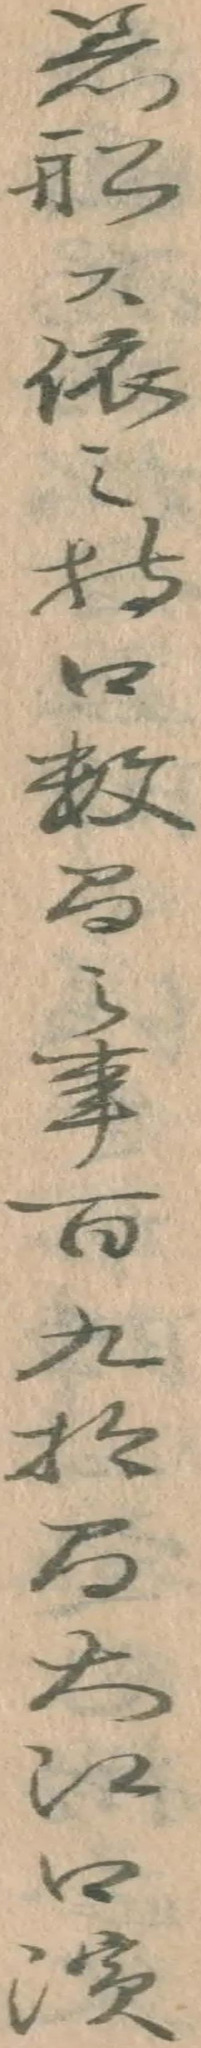着舩す依之持口数間之事百九拾間大江口浜
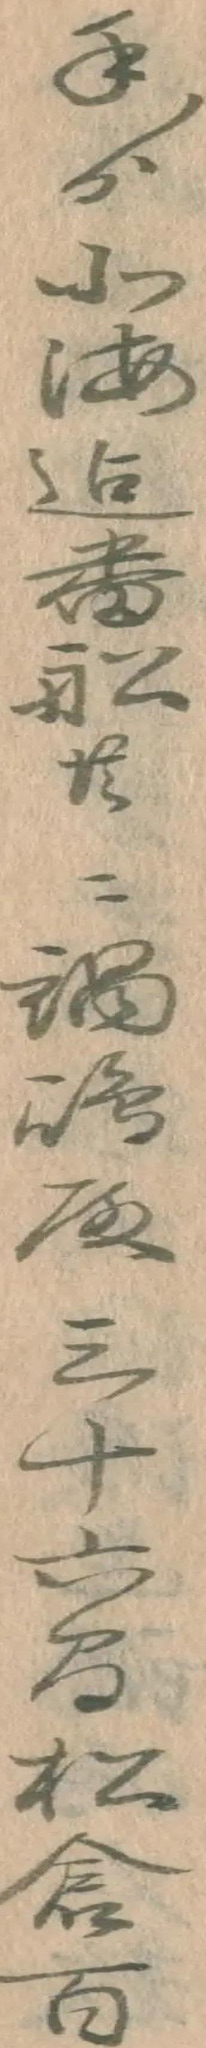手ゟ北海迄番舩共に鍋島殿三十六間松倉百
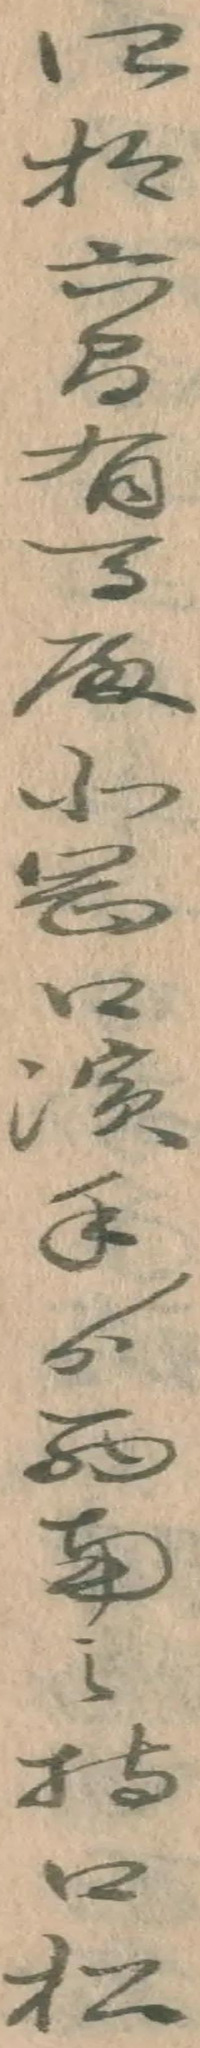四拾六間有馬殿北岡口浜手ゟ西南之持口松
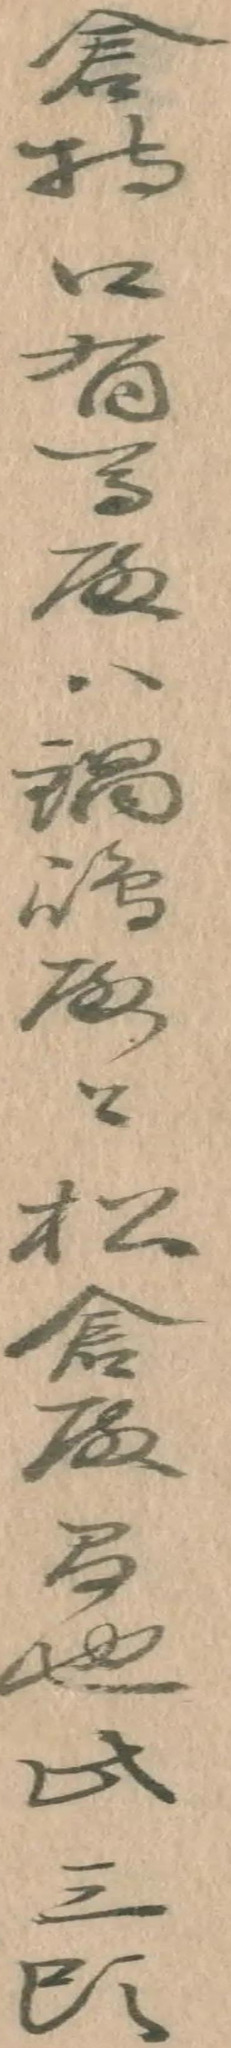倉持口有馬殿は鍋島殿と松倉殿間也此三頭
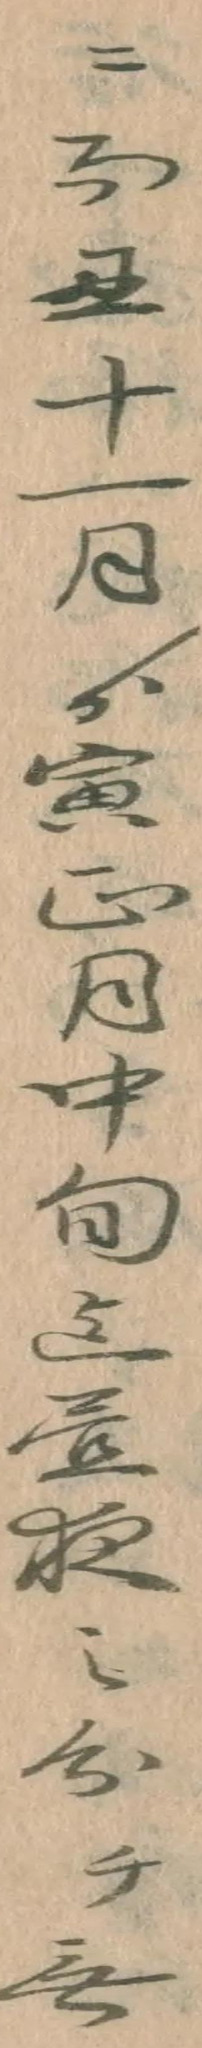に而丑十一月ゟ寅正月中旬迄昼夜之分て無
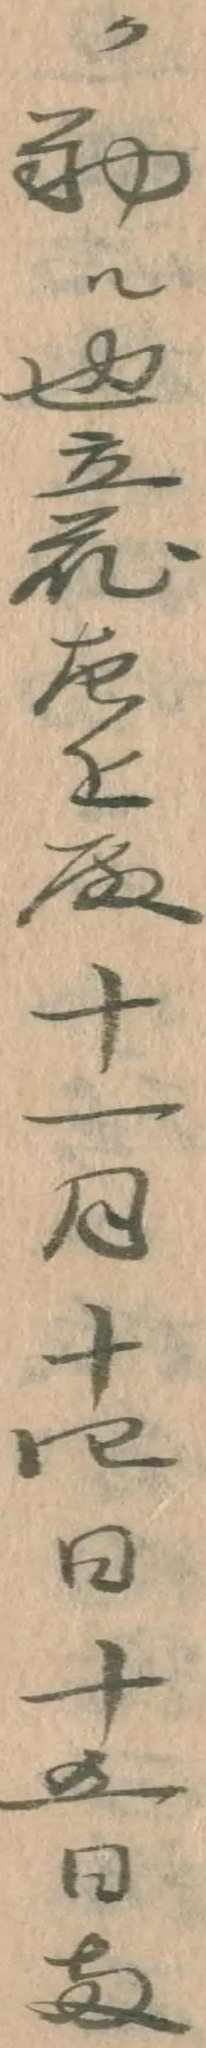く勤る也立花左近殿十一月十四日十五日両
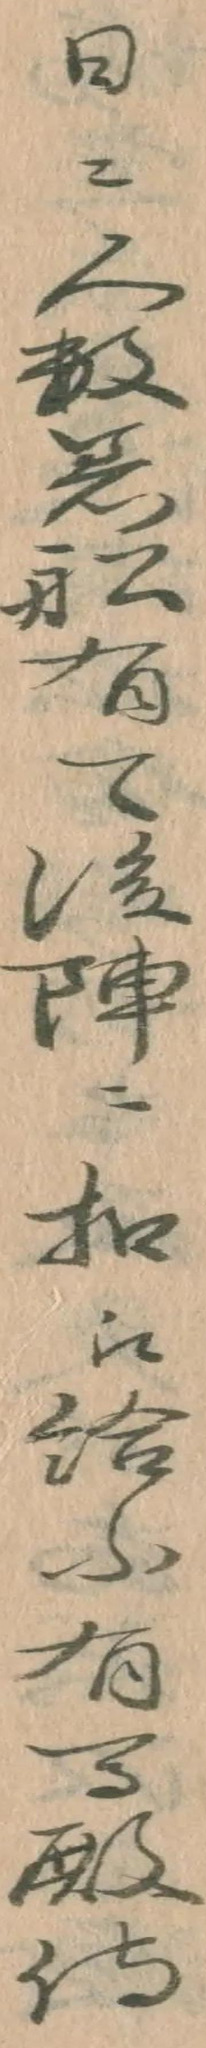日に人数着舩有て後陣に扣江給ふ有馬殿侍
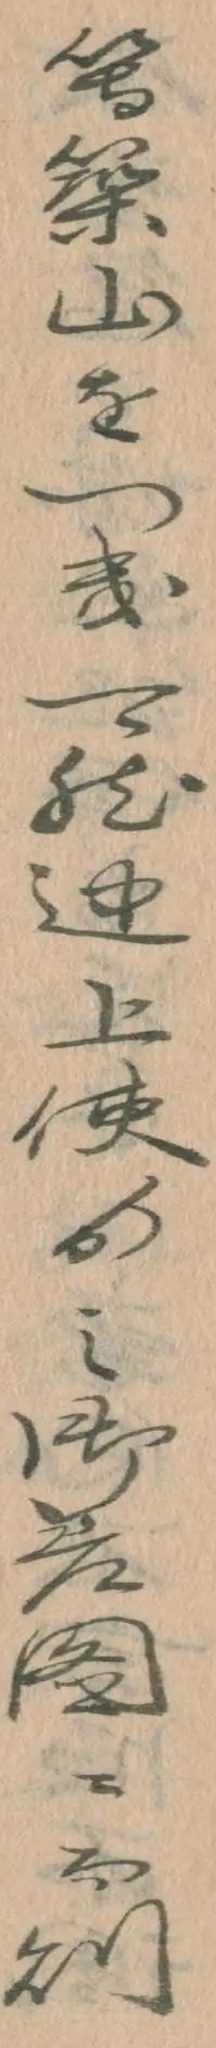等築山をつ幾可然迚上使ゟ之御差図に而則
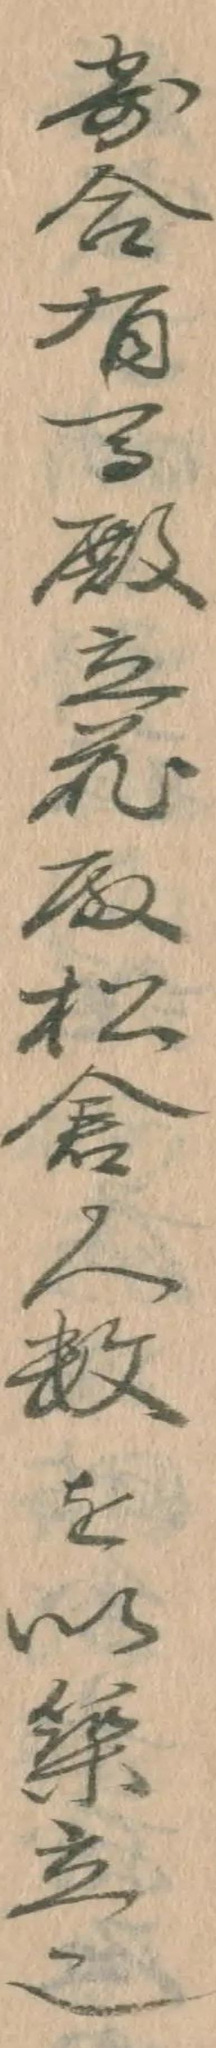寄合有馬殿立花殿松倉人数を以築立也
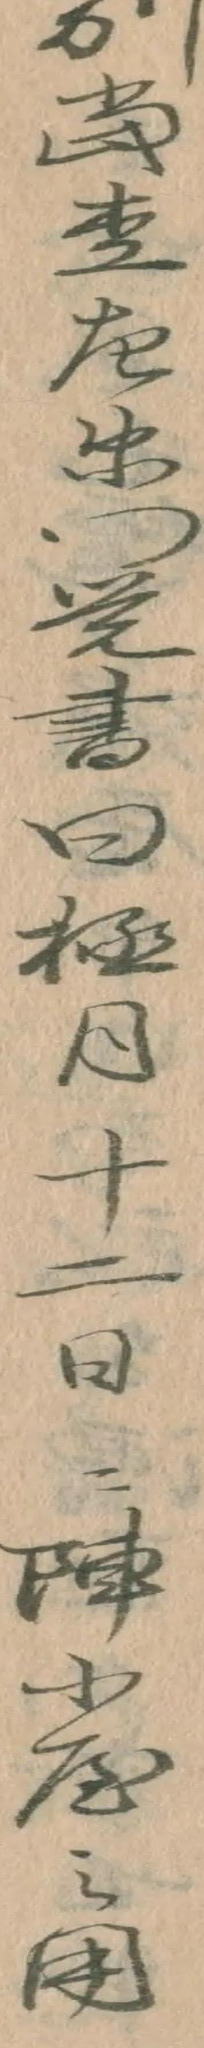別当杢左衛門覚書曰極月十二日に陣小屋之用
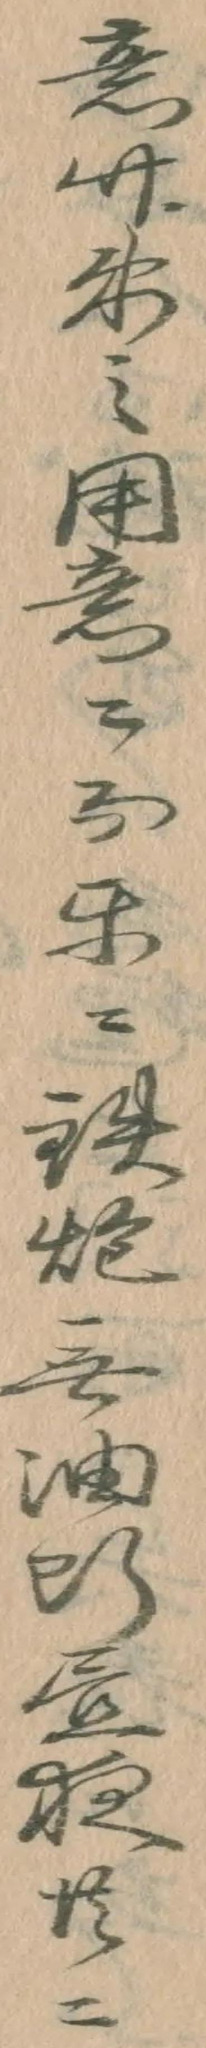意竹束之用意に而互に鉄炮無油断昼夜共に
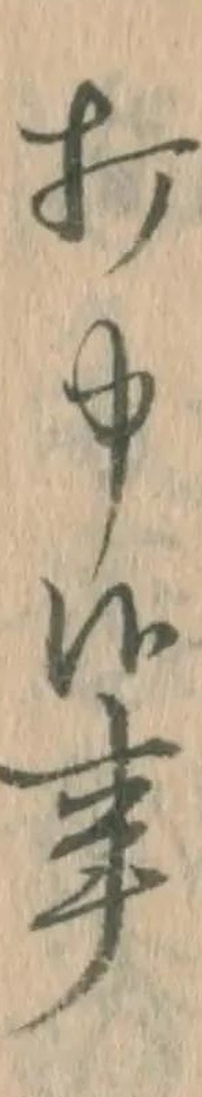打申候事
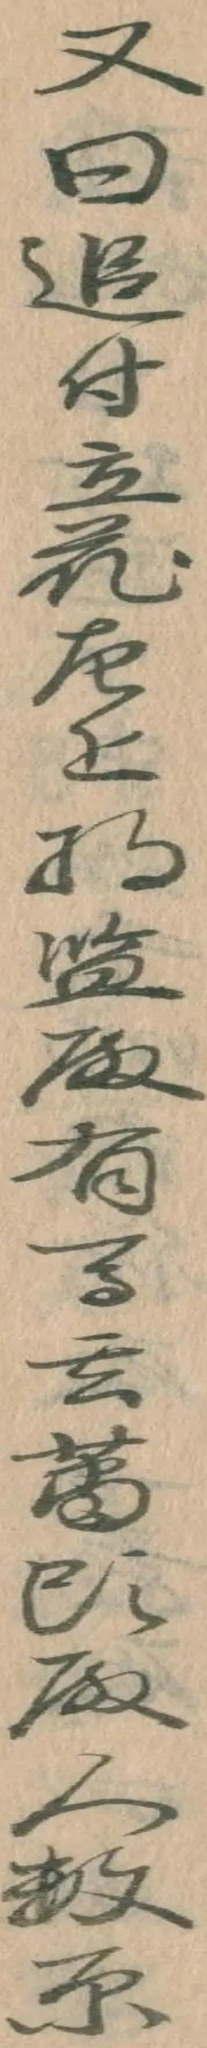又曰追付立花左近将監殿有馬玄蕃頭殿人数原
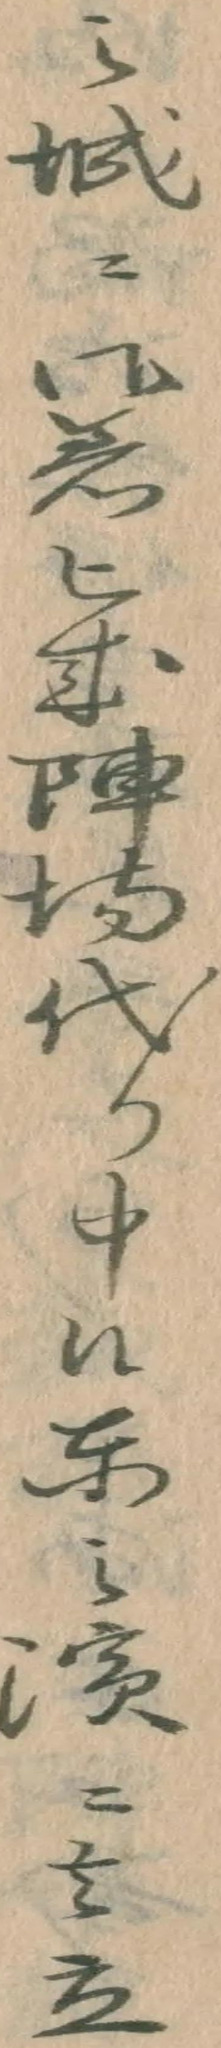之城に御着被成陣場代り申候東之浜に者立
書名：切支丹御退治記 49巻. [4]
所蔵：国立国会図書館 National Diet Library, JAPAN
